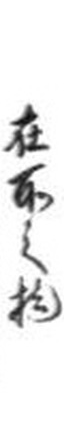在所之物
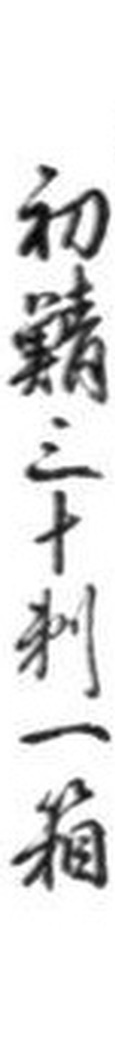初鯖三十刺一箱
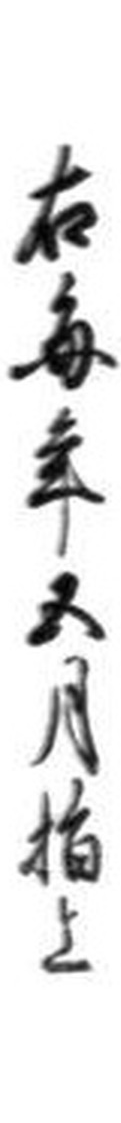右毎年五月指上
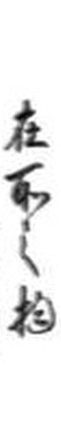在所之物
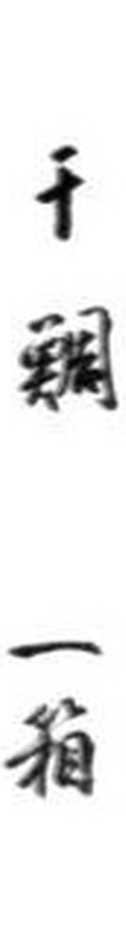干鯛一箱
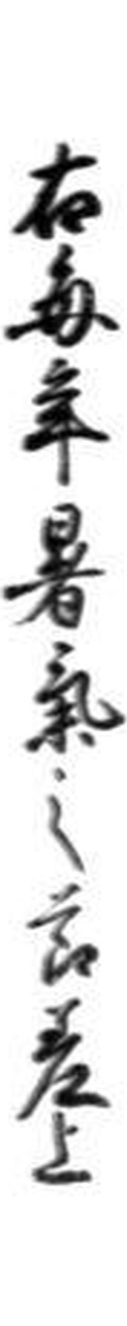右毎年暑気之節差上
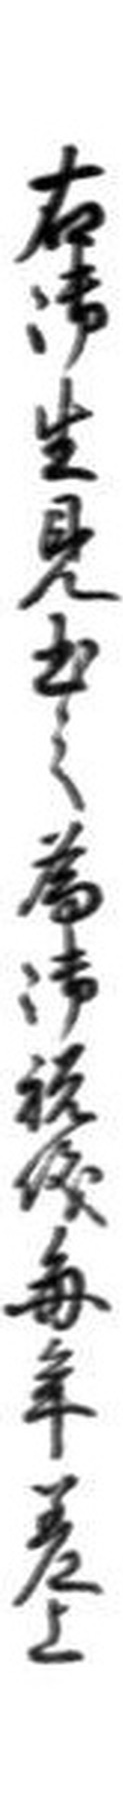右温生見玉之為御祝儀毎年差上
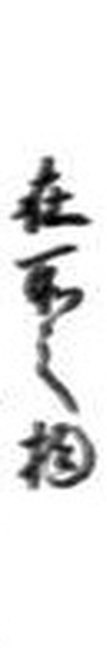在所之物
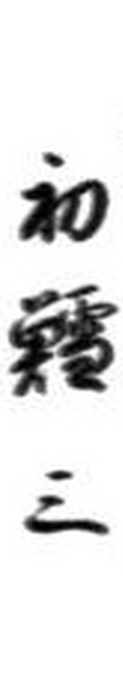初鱈三
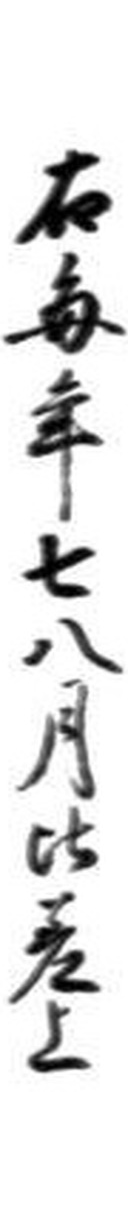右毎年七八月頃差上
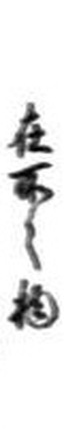在所之物

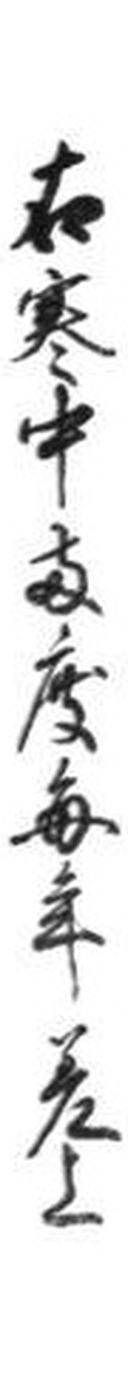右寒中両度毎年差上
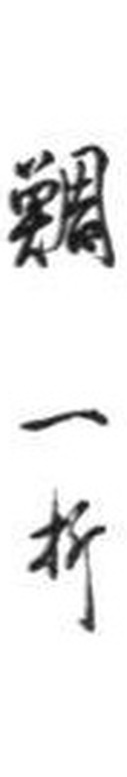鯛一折
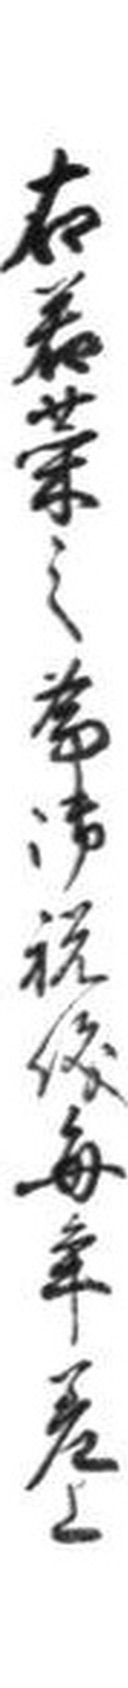右若菜之為御祝儀毎年差上
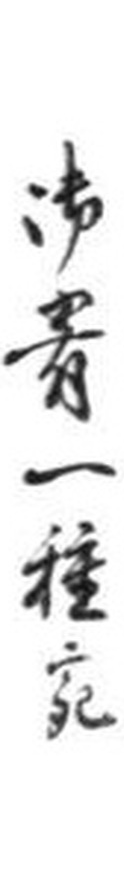御肴一種宛
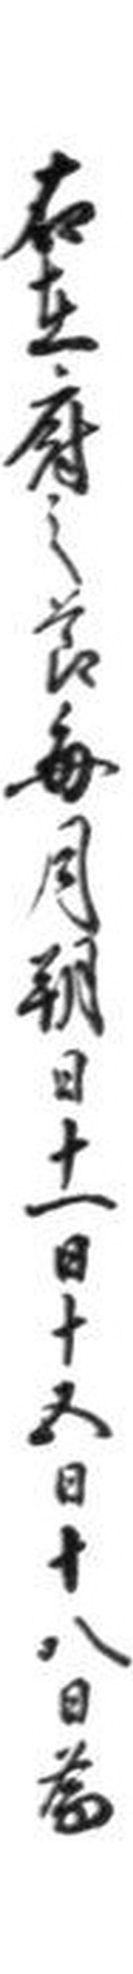右在府之節毎月朔日十一日十五日十八日為
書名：家譜 三十一 吉邦公 享保元年
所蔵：福井県文書館 Fukui Prefectural Archives
